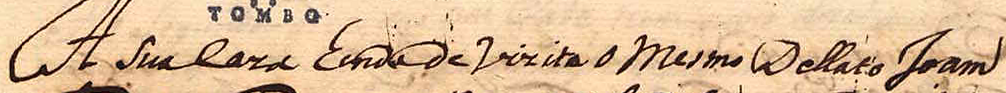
A sua caza hindo de Vizita o mesmo Dellato Joam
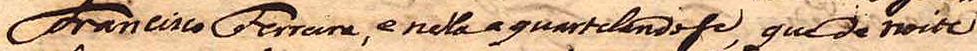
Francisco Ferreira, e nela aquartelandose, que de noite
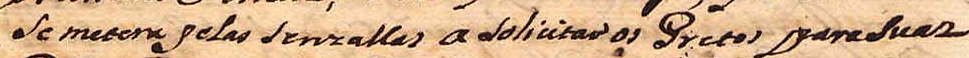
se metera pelas senzallas a solicitar os Pretos para suaz
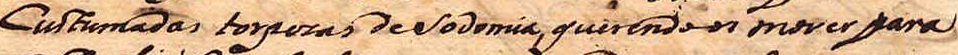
Custumadas torpezas de sodomia, querendo os mover para
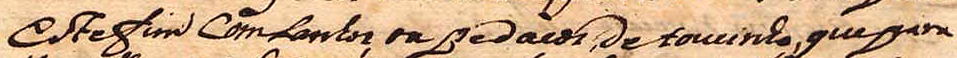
Este fim com Lanhos, ou pedaços, de toucinho, que para
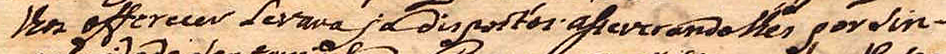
lhos offerecer Levava ja dispostos asseverandolhes por sin
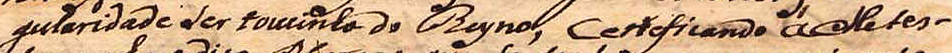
gularidade ser toucinho do Reyno, Certeficando a elle tes
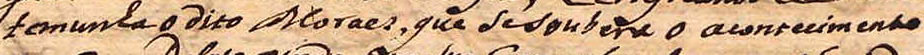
temunha o dito Moraes, que se soubera o acontecimento
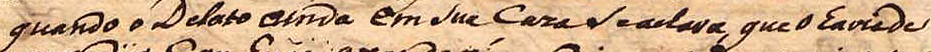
quando o Delato ainda em sua caza se achava, que o havia de
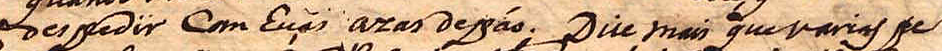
despedir com huās azas de páo. Dise mais que varias pe
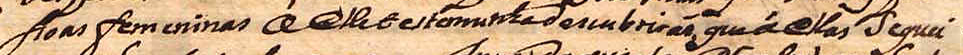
ssoas femeninas a elle testemunha descubriraõ, que á ellas Se quei
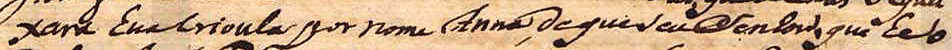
xara hua crioula por nome Anna, de que seu Senhor do que he o
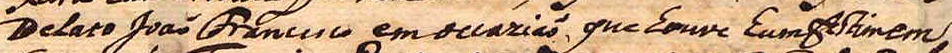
Delato Joaõ Francisco em occaziaõ que houve hum festim em
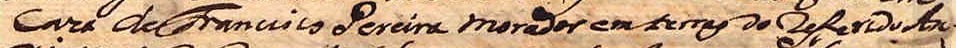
Caza de Francisco Pereira morador em terras do Referido An
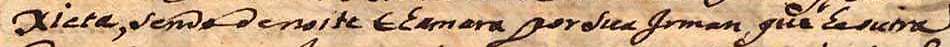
xieta, sendo de noite chamara por sua Jrman, que he outra
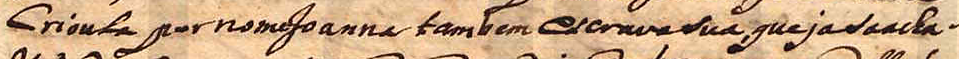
Crioula por nome Joanna tambem escrava sua que ja se acha
